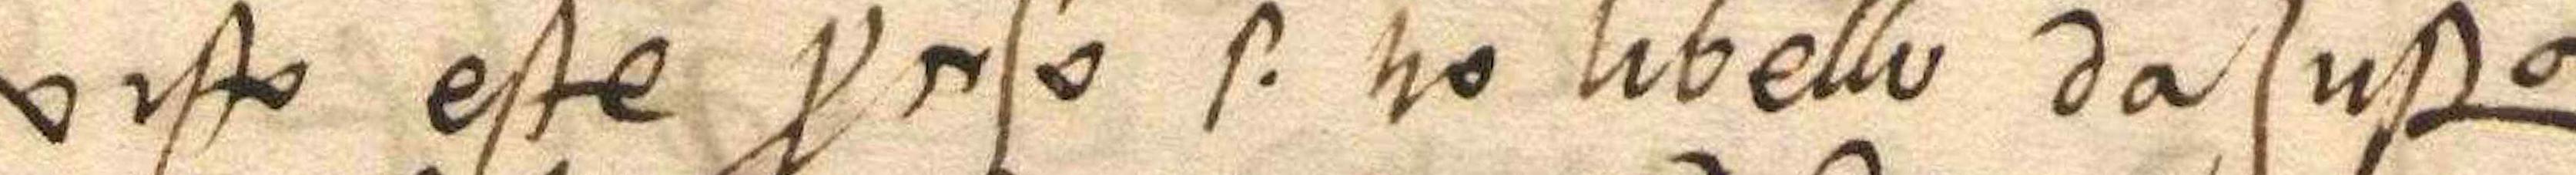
Visto este ꝓceso s. ho libello da Justa
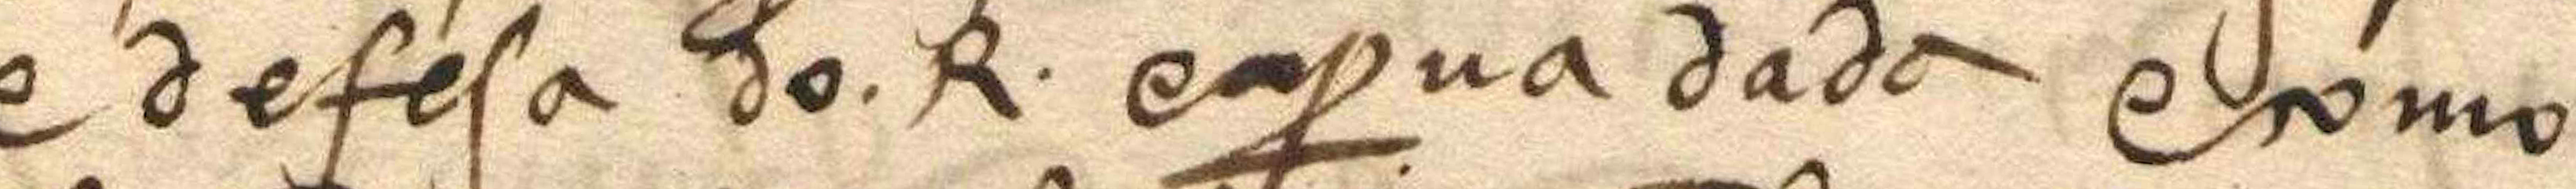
e defesa do .R. e a ꝓua dada e como
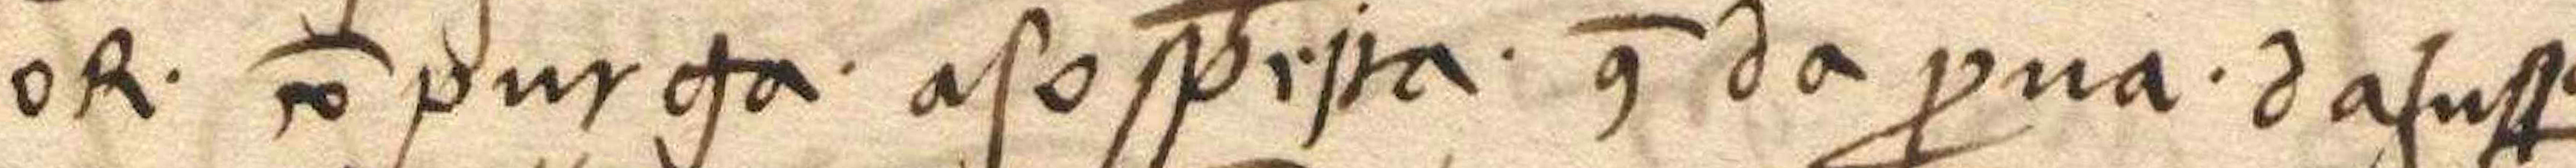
o R. c̄o purga. a sospejta. q̄ da ꝓua. da Justa
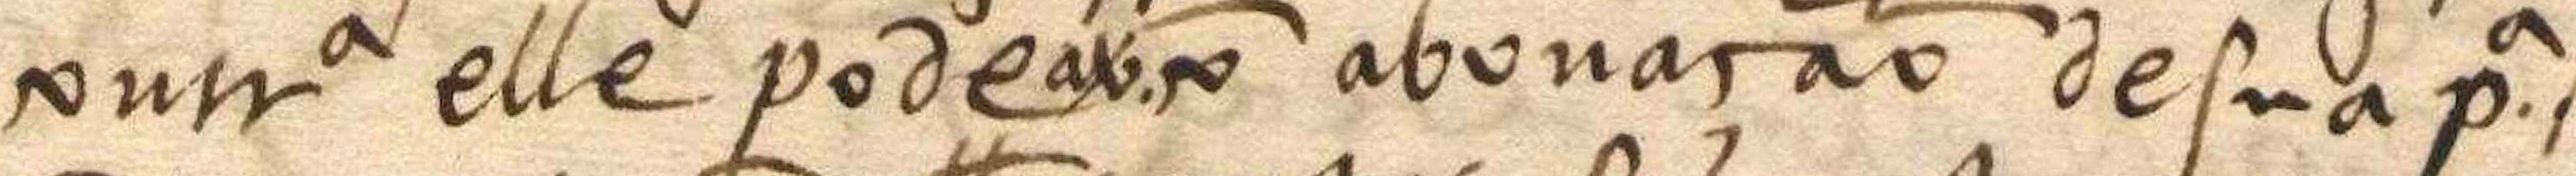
contra elle pode aꝟ. c̄o abonaçaõ de sua pa./
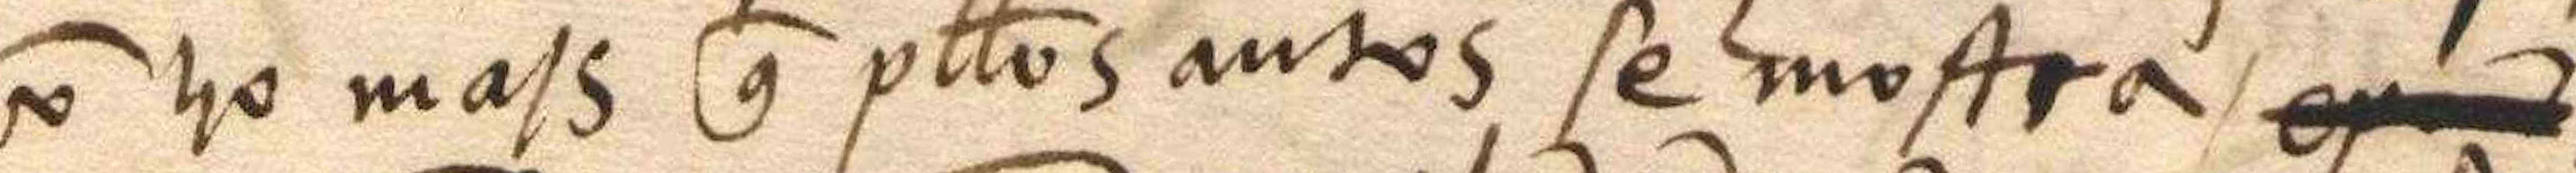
cō ho maJs q̄ pl̄los autos se mostra / e porē
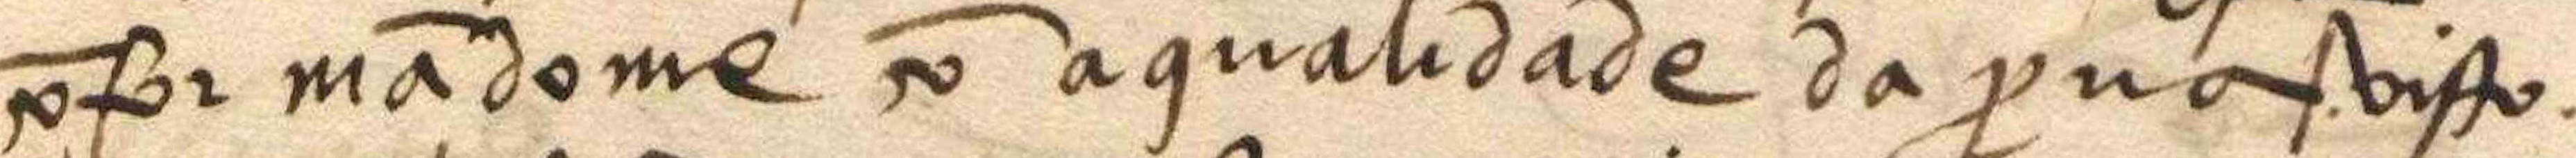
c̄oformādome c̄o a qualidade da ꝓua/. visto.
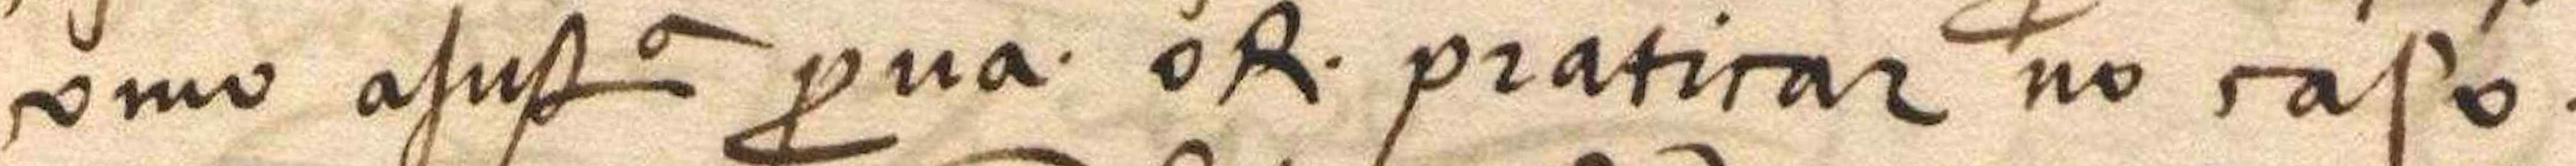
como a Justa ꝓua. o R. praticar no caso.
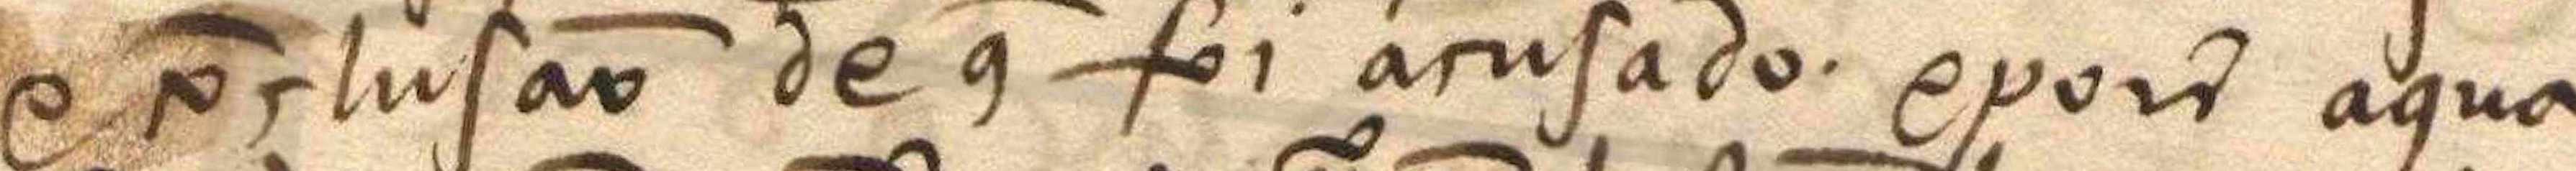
e c̄oclusão de q̄ foi acusado. e porē a qua
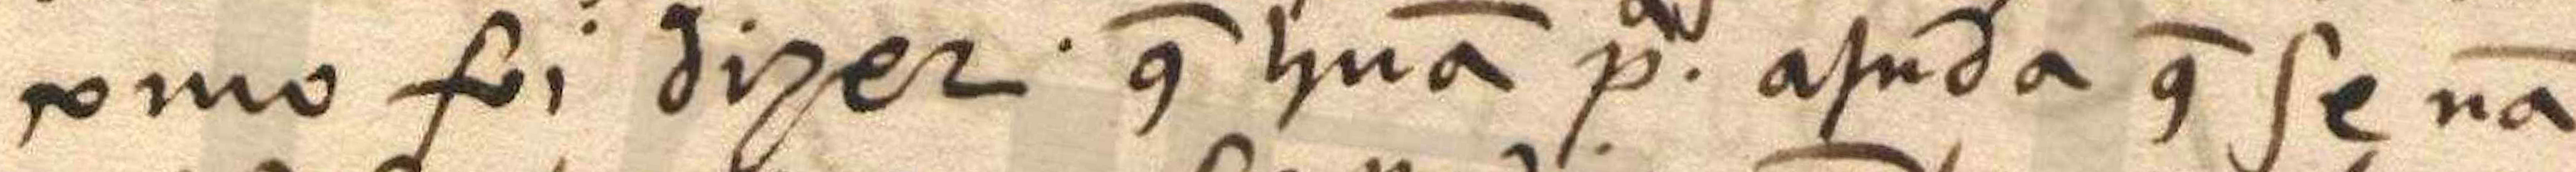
como foi dizer. q̄ huā pa. aJnda q̄ se nā
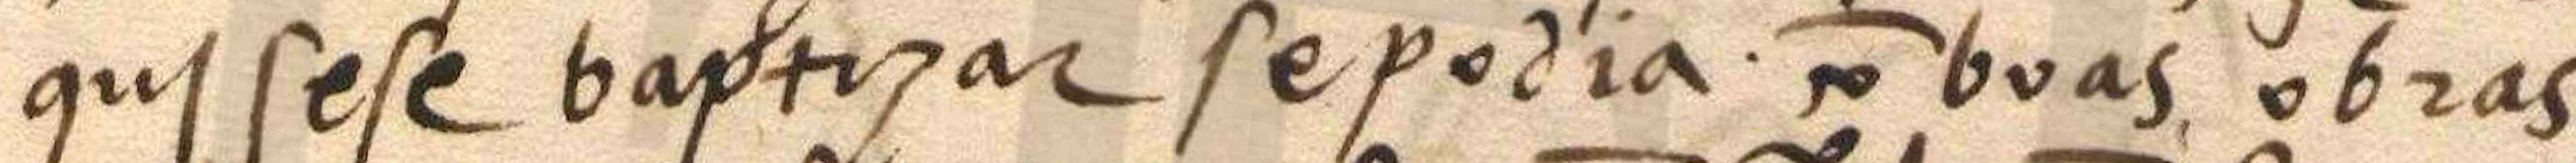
qujsese baptizar se podia. cō boas obras
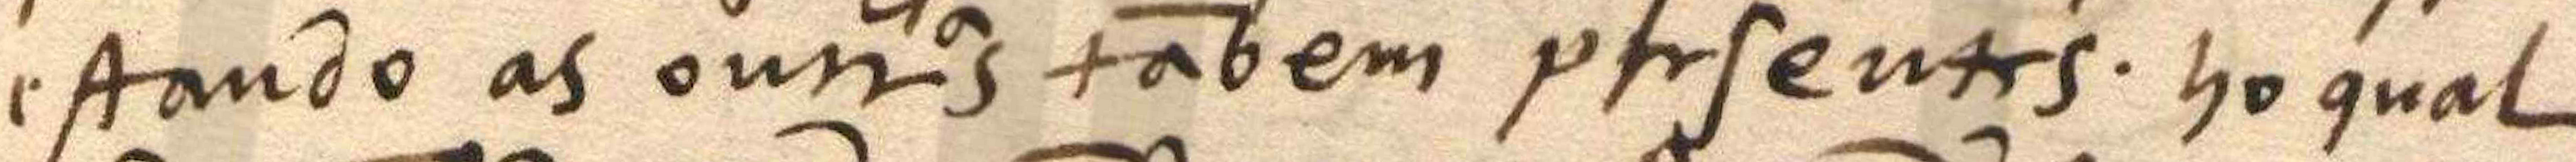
estando as outras tābem presentes. ho qual
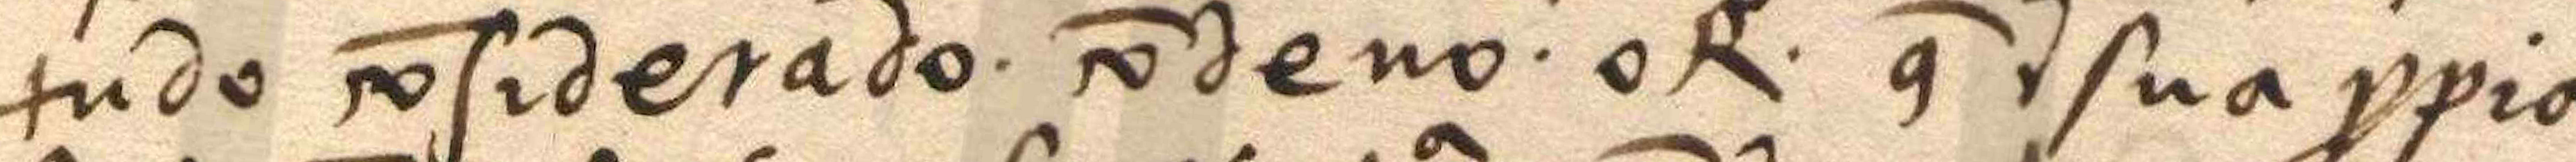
tudo c̄osiderado. c̄odeno. o R. q̄ ē sua ꝓpia
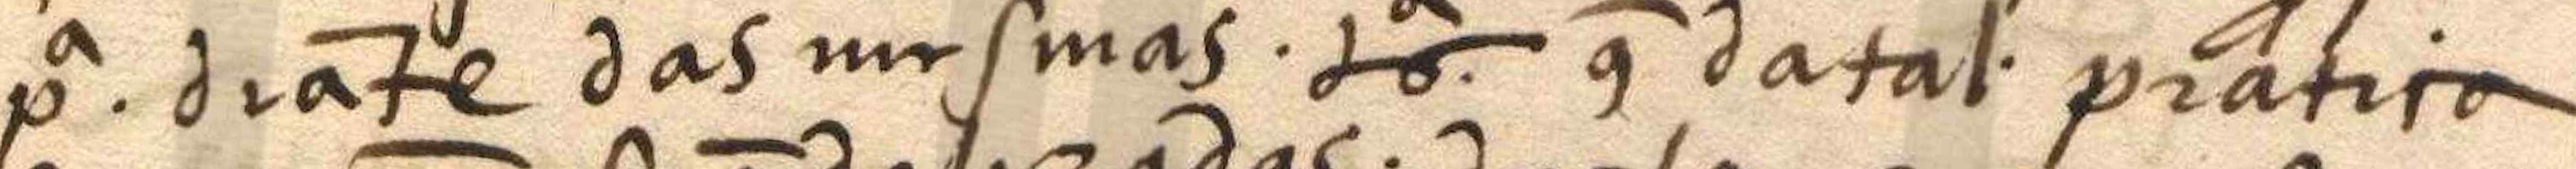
pa. diāte das mesmas. tas. q̄ da tal. pratica
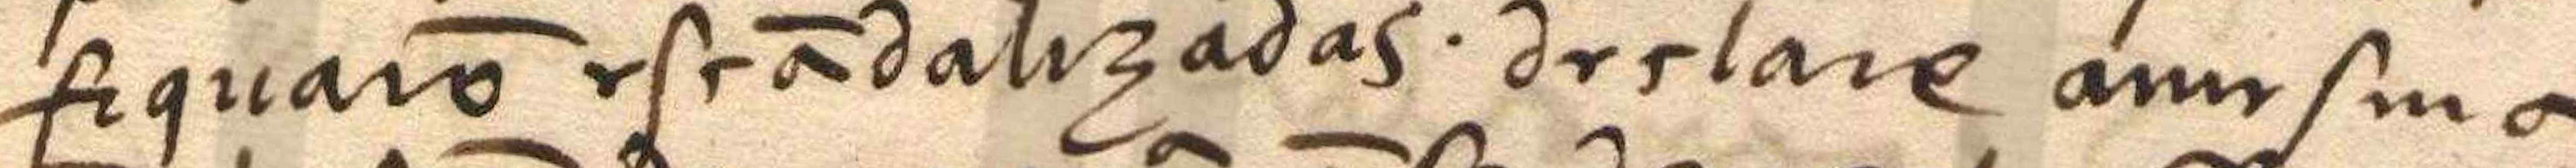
fiquarō escādalizadas. declare a mesma
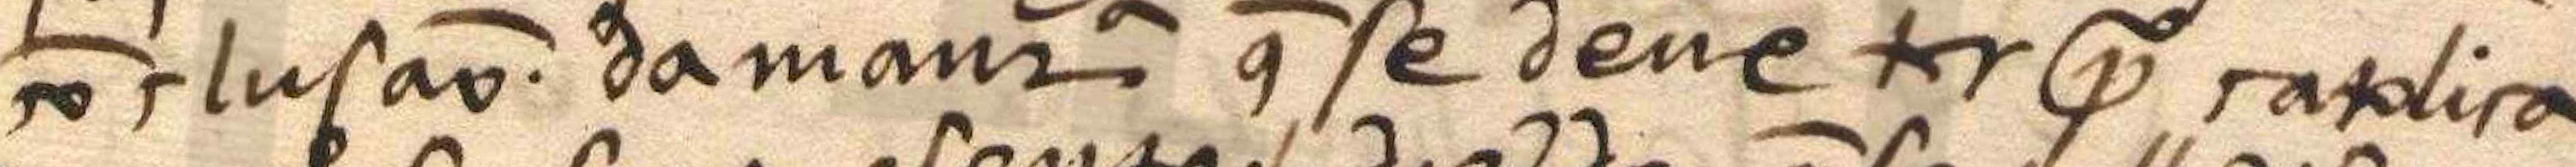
c̄oclusão. da manra q̄ se deue ter p̄o catolica
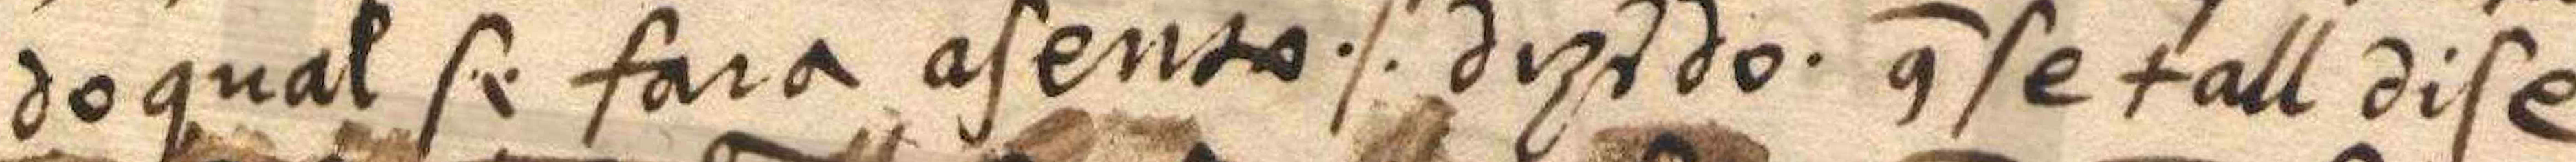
do qual se fara asento./. dizēdo. q̄ se tall dise
